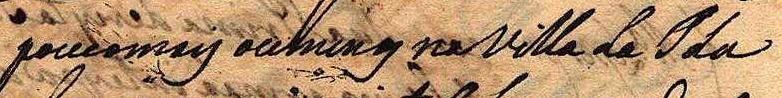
pouco mais ou menos na Villa da Ida
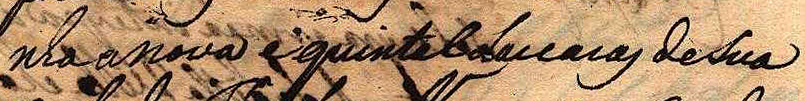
nha a nova e quintal das cazas de sua
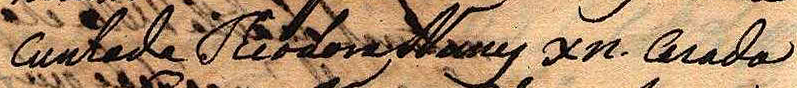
cunhada Theodora Nunes xn. cazada
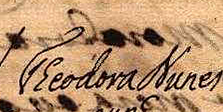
Theodora Nunes
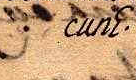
cunh.
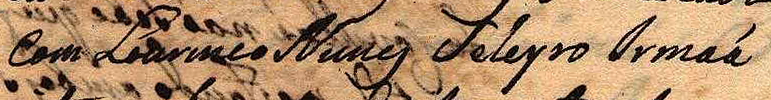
com Lourenço Nunes Seleyro Irmaã
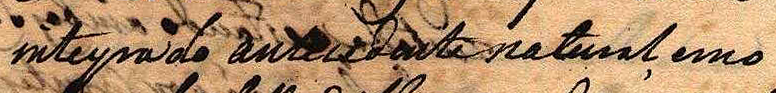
inteyra do antecedente natural, e mo
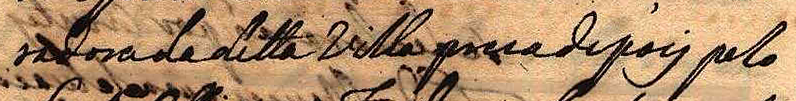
radora da ditta Villa preza depois pelo
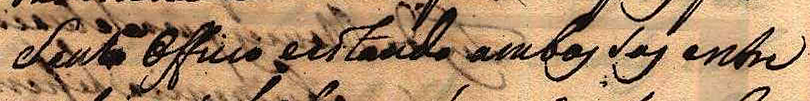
Santo Officio e estando ambas sos entre
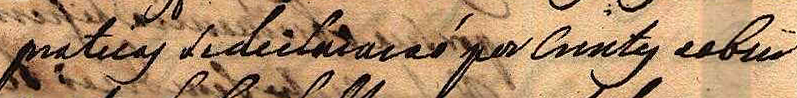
praticas se declararaõ por crentes e obser
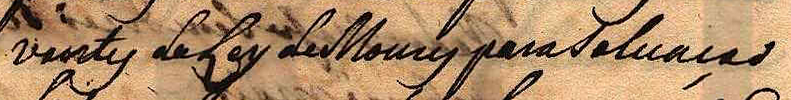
vantes da Ley de Mouzes para Saluaçaõ
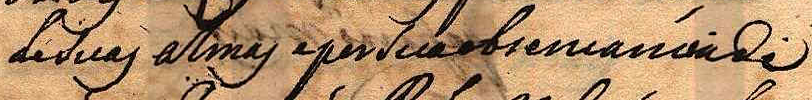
de Suas almas e por sua obseruancia di
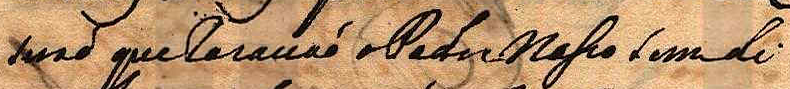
seraõ que Rezauaõ o Padre Nosso sem di
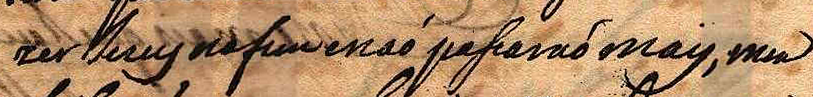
zer Iezus no fim e naõ passaraõ mais, nem
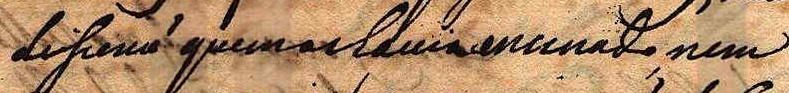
disseraõ quem as hauia encinado, nem
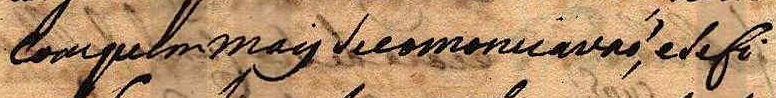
com quem mais se comonicavaõ, e se fi
